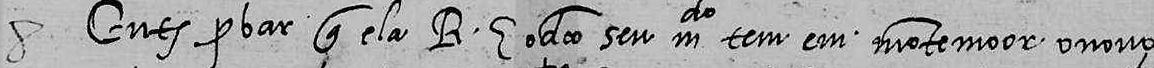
8 Entꝭ ꝓvar q̄ ela R. E o d̄co seu mdo tem em mōtemoor o nouo
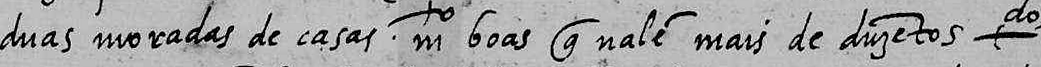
duas moradas de casas mto boas q̄ ualē mais de de duzētos +dos
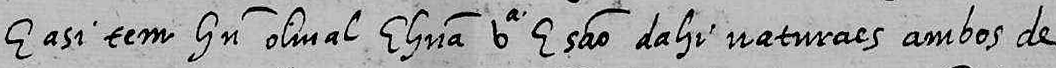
E asi tem hū oliual E huā va E saõ dahi naturaes ambos de
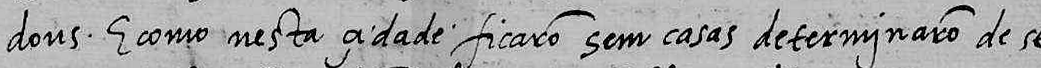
dous. E como nesta cidade ficarō sem casas determjnarō de se
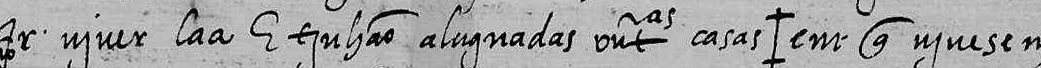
Jr ujuer laa E tjnhão aluguadas outras casas em q̄ ujuesem
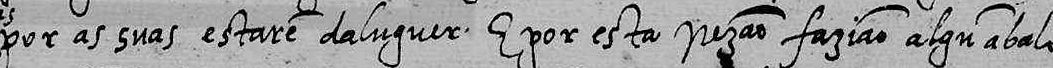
por as suas estarē daluguer. E por esta rrezão fazião algū abalo
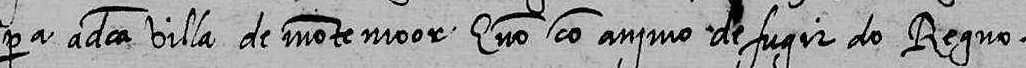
ꝑa a d̄ca villa de mōtemoor E n̄o c̄o anjmo de fugir do Regno.
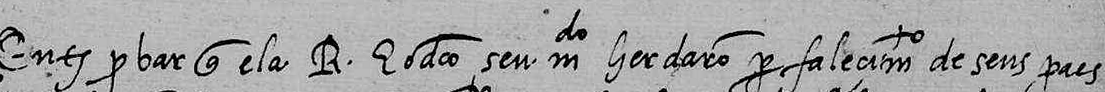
Entꝭ ꝓvar q̄ ela R. E o d̄co seu mdo herdarō ꝑ falecimto de seus paes
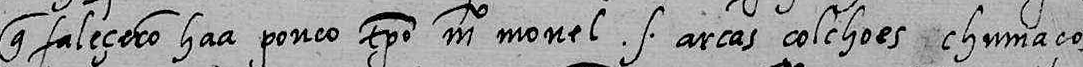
q̄ falecerō haa pouco t̄po mto mouel .s. arcas colchoes chumaços
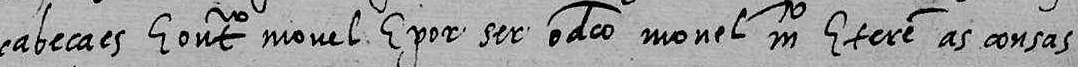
cabeçaes E outro mouel E por ser o d̄co mouel mto E terē as cousas
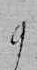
9
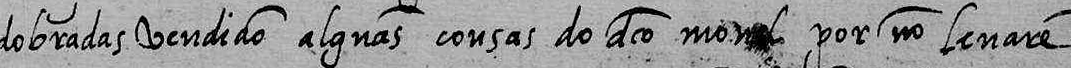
dobradas vendiaõ alguās cousas do d̄co mouel por n̄o leuarē
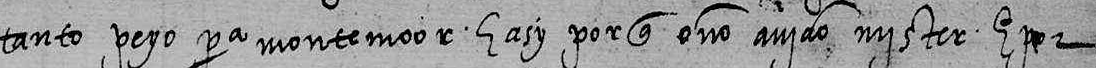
tanto peyo ꝑa montemoor . E asy porq̄ o n̄o aujaõ mjster E por
